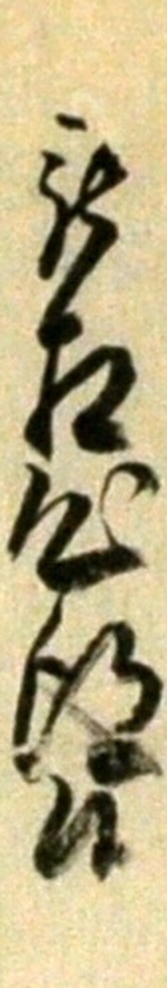被相心得候
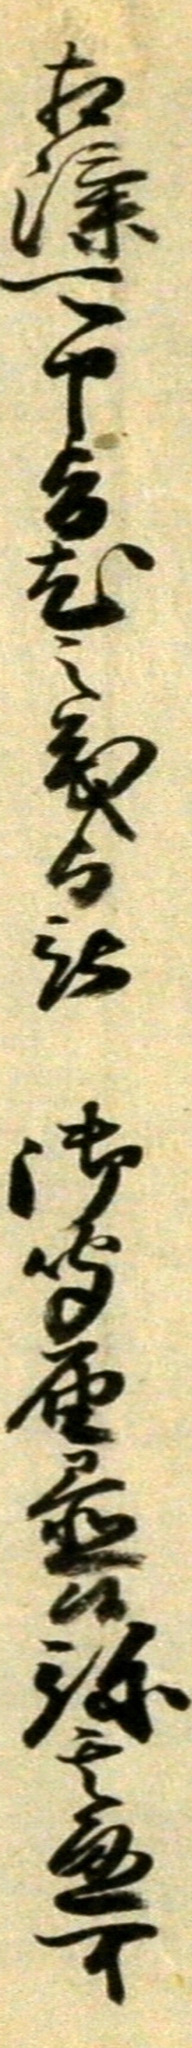相済可申旨尤之義と被御聞届置候弥其通可
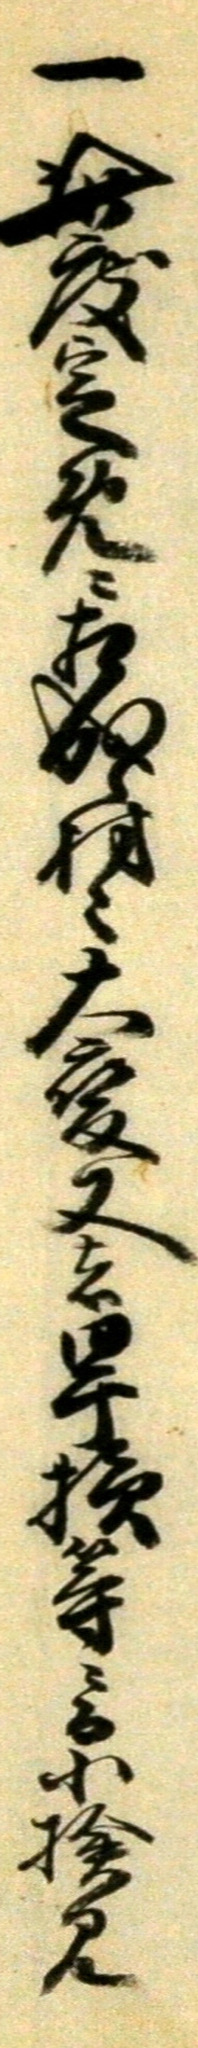一此度定免ニ相成候村々大変又者旱損等ニ而小検見
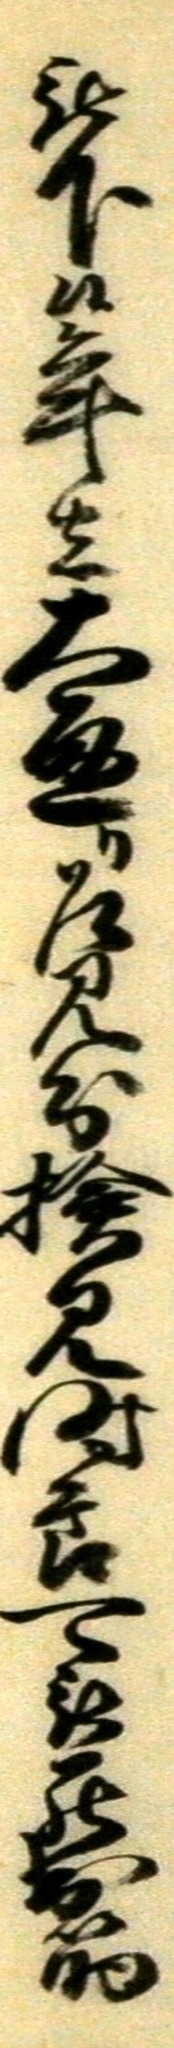被下候年者大通り乍見分検見時節可被罷出筋
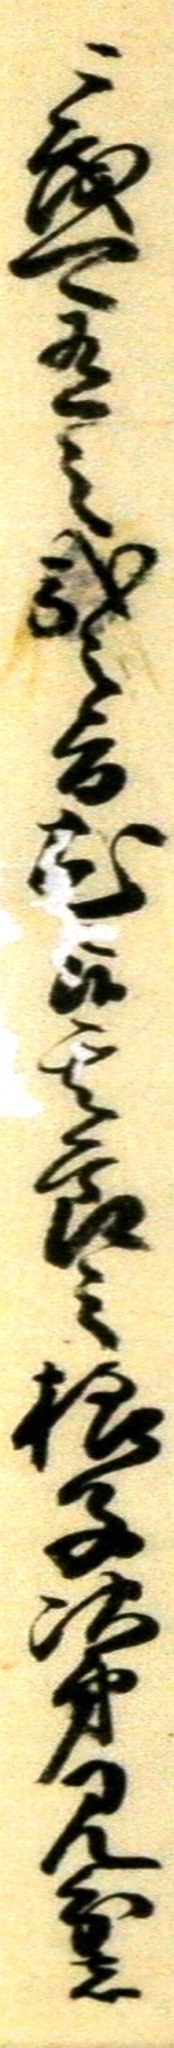ニ茂可有之哉之旨尤候其節之様子次第見分者

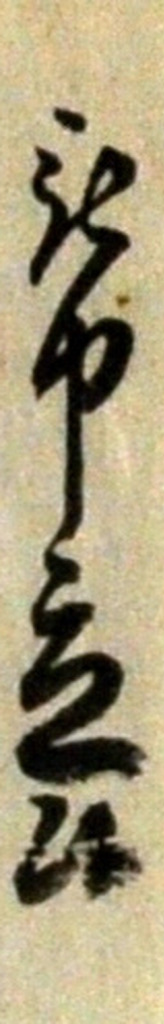被申立候
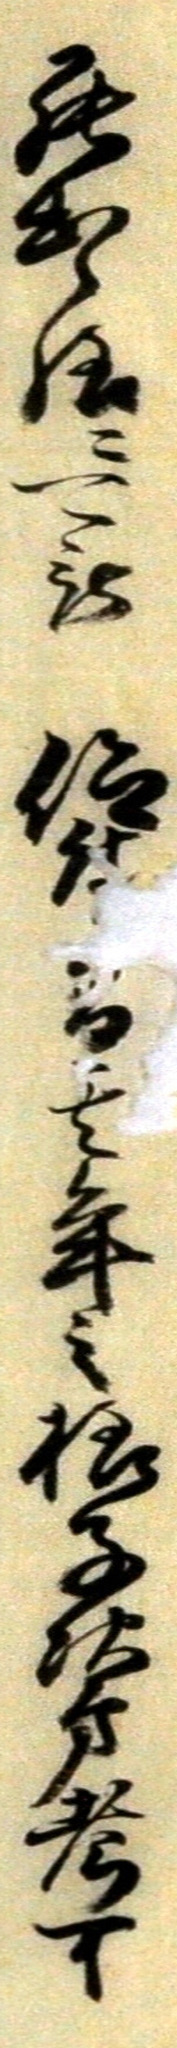罷出候様ニ可被仰付其年之様子次第考可
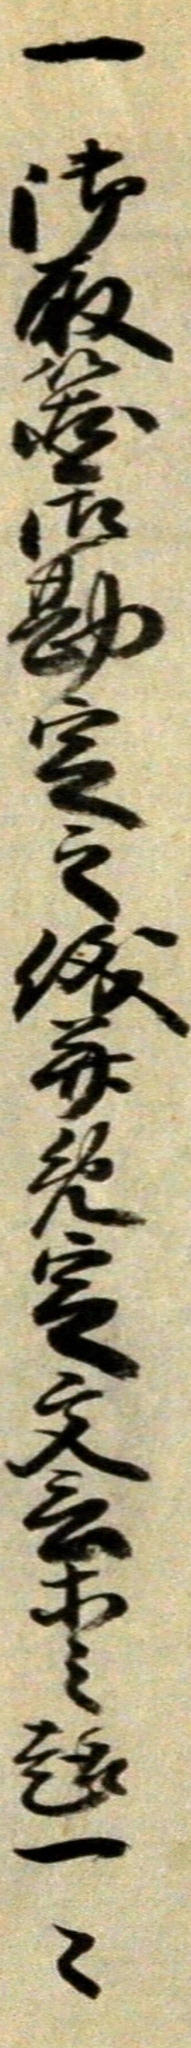一御取箇御勘定之儀幷免定文言等之趣一々
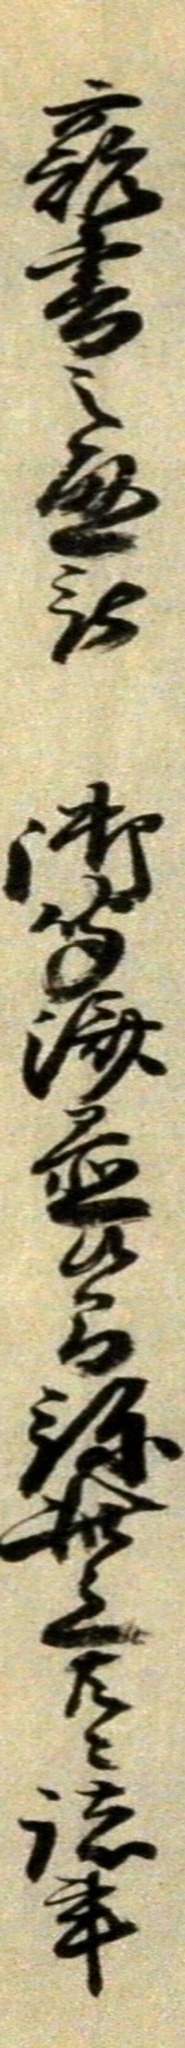窺書之通被御聞済置候間弥此上共ニ諸事
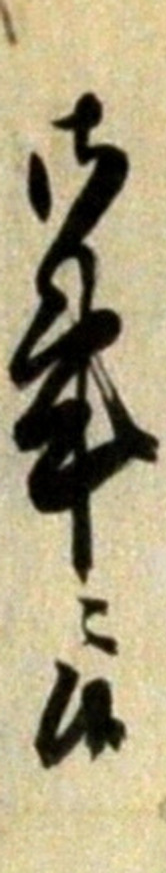御事ニ候
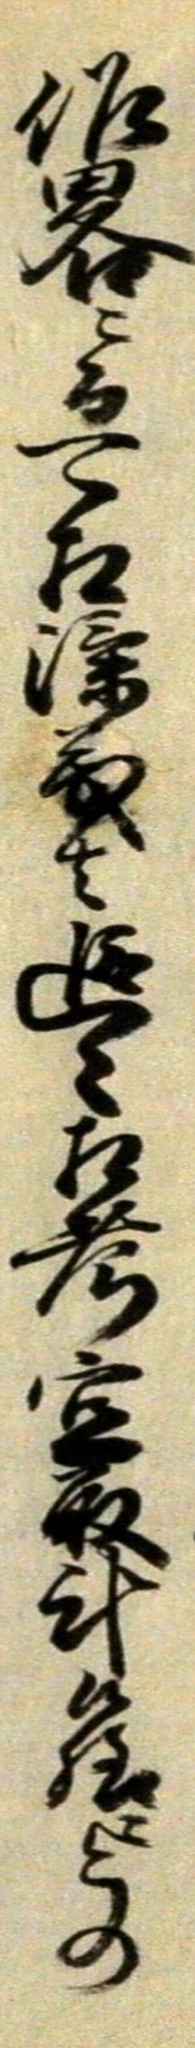作略ニ而可相済義者追々相考宜取斗候様ニとの
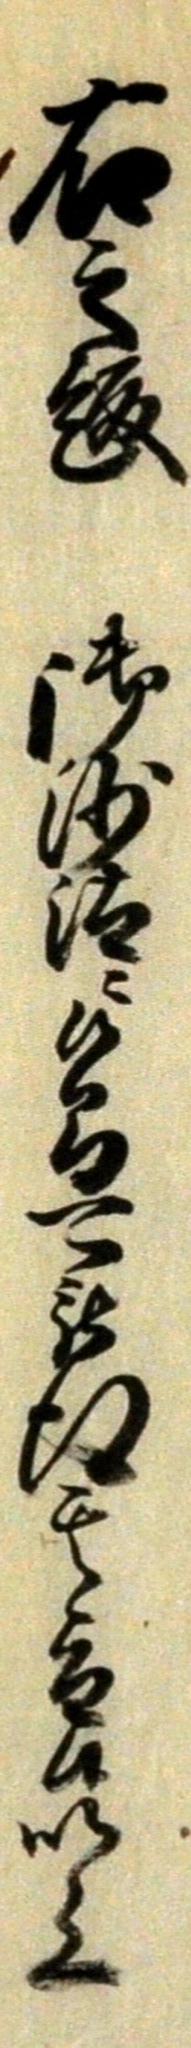右之趣御沙汰ニ候間可被得其旨候以上
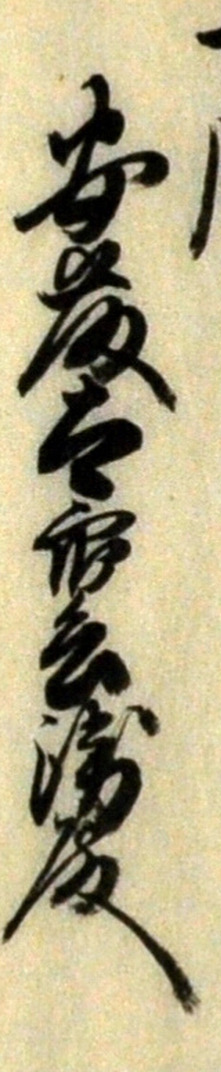安藤太郎兵衛殿
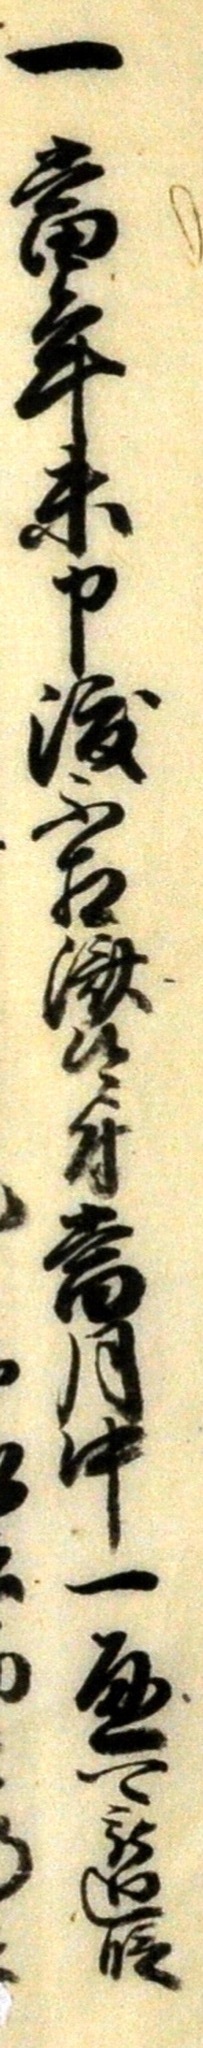一当年未申渡不相済候ニ付当月中一通可被廻段
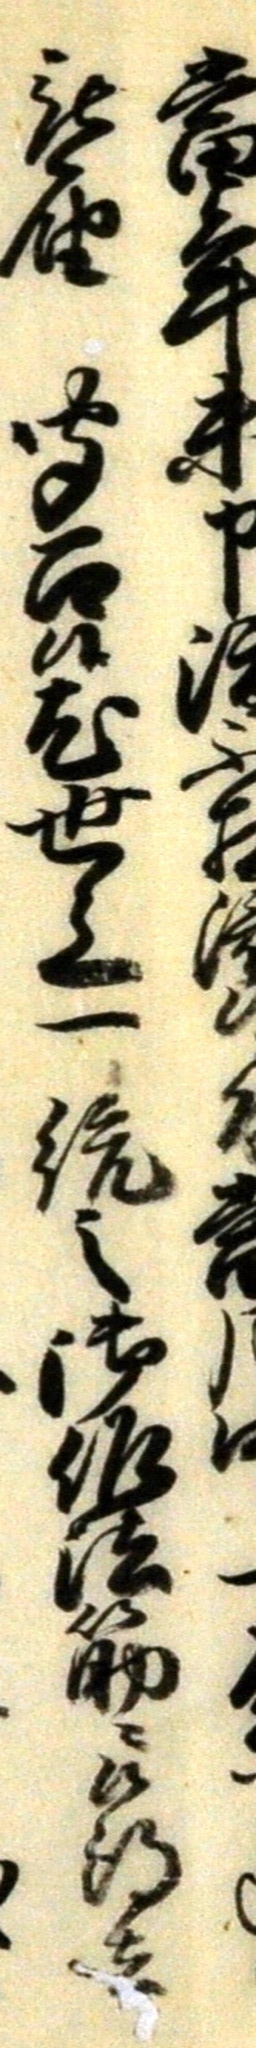被届聞召候尤世上一統之御作法筋ニ候得者
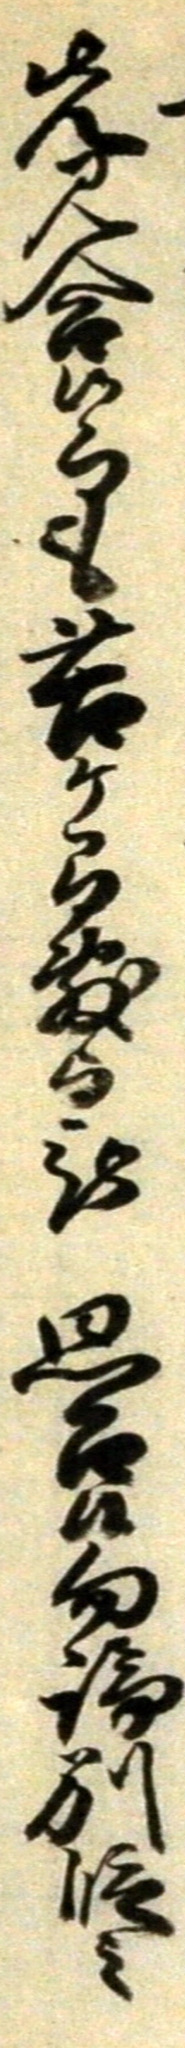先見合候而も苦ヶ間敷と被思召候勿論別段之
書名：留書
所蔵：伊那市立高遠町図書館・合同会社AMANE
